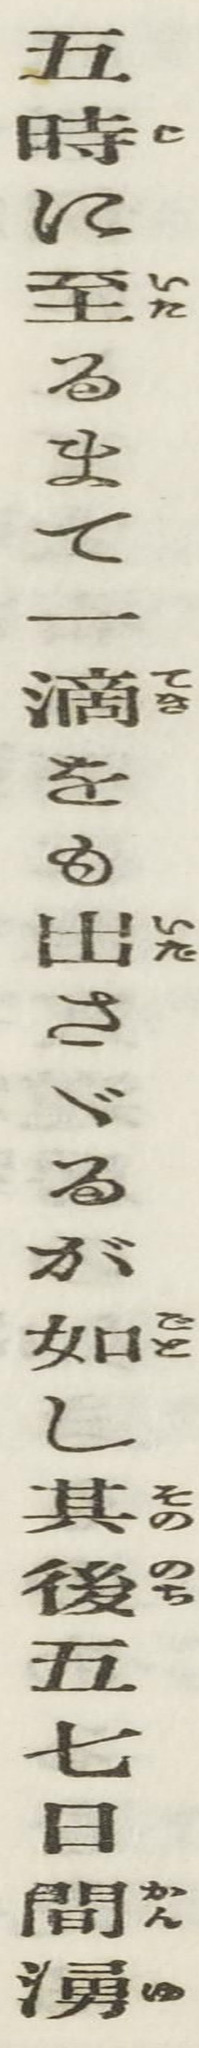五時に至るまて一滴をも出さゞるが如し其後五七日間湧
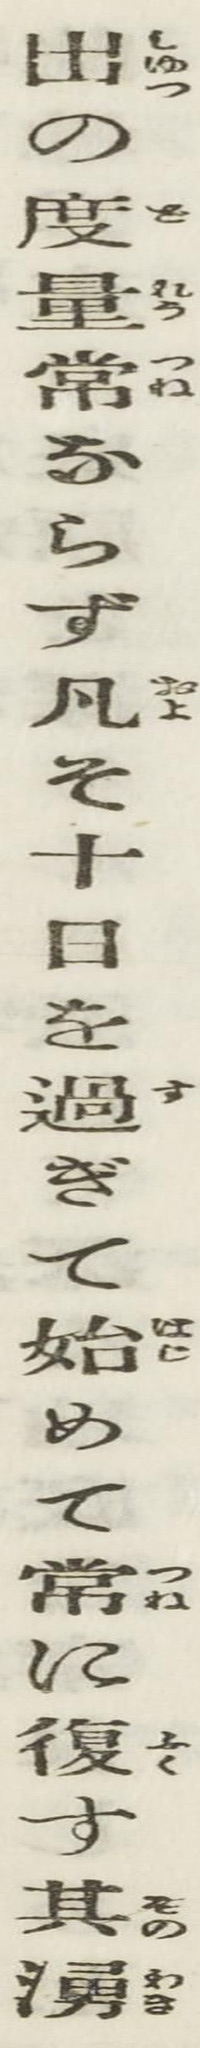出の度量常ならず凡そ十日を過ぎて始めて常に復す其湧
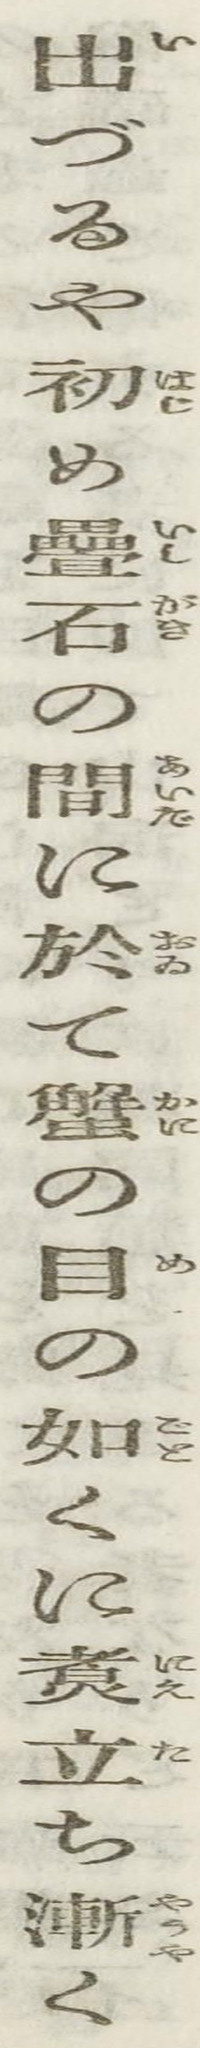出づるや初め畳石の間に於て蟹の目の如くに煮立ち漸く
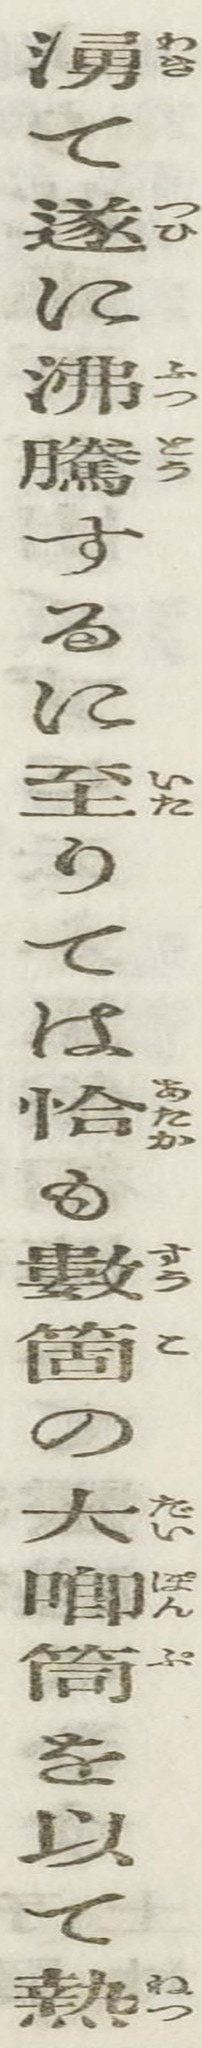湧て遂に沸騰するに至りては恰も数箇の大喞筒を以て熱
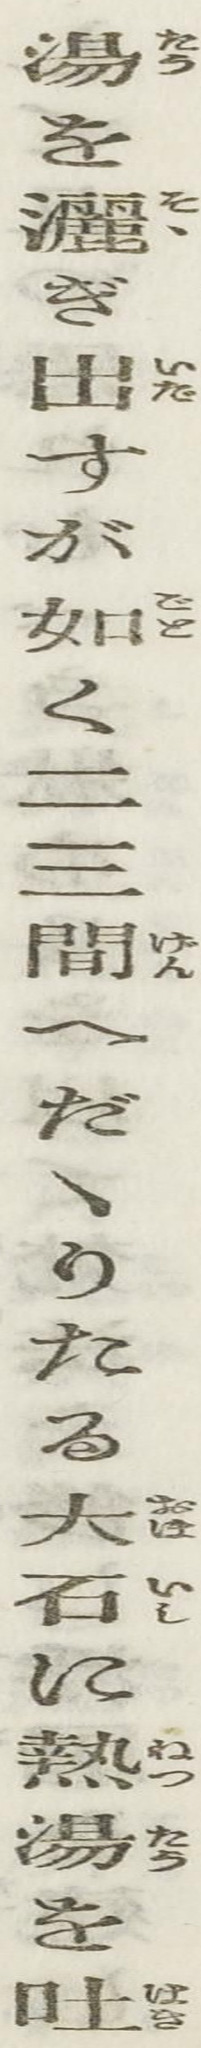湯を注ぎ出すが如く二三間へだゝりたる大石に熱湯を吐
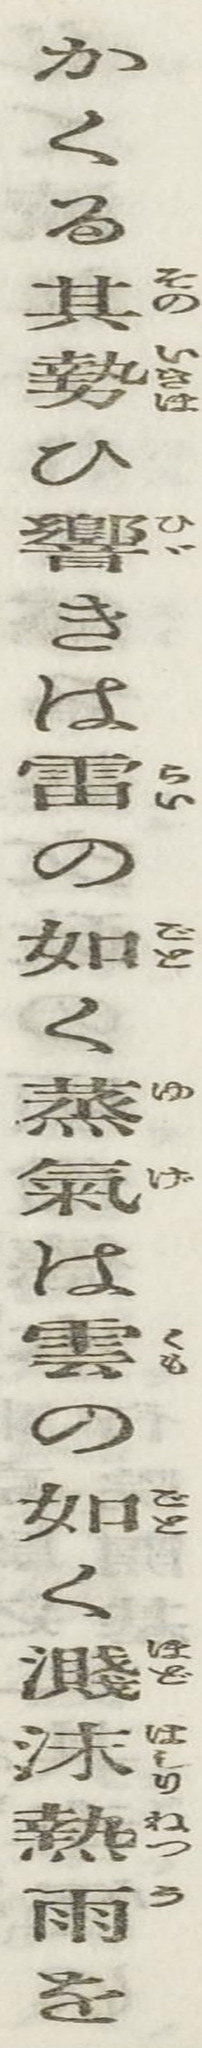かくる其勢ひ響きは雷の如く蒸気は雲の如く濺沫熱雨を
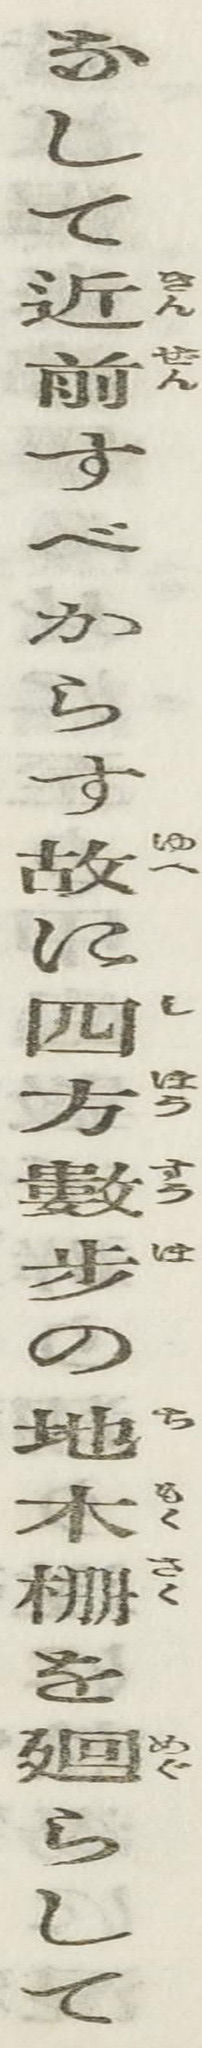なして近前すべからす故に四方数歩の地木柵を廻らして
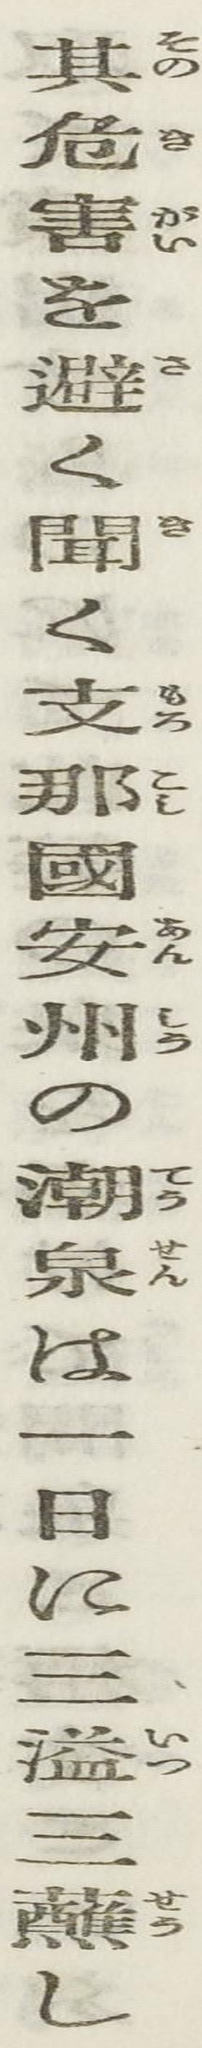其危害を避く聞く支那國安州の潮泉は一日に三溢三蘸し
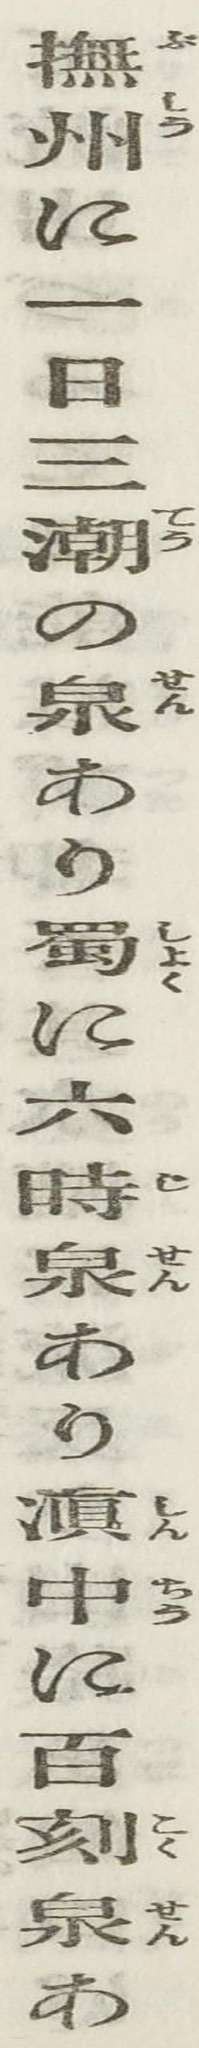撫州に一日三潮の泉あり蜀に六時泉あり滇中に百刻泉あ
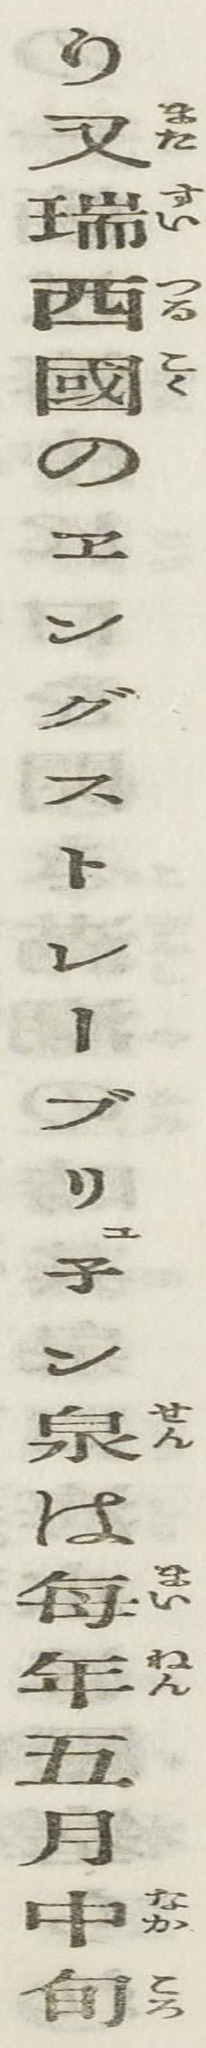り又瑞西國のヱングストレーブリュ子ン泉は毎年五月中旬
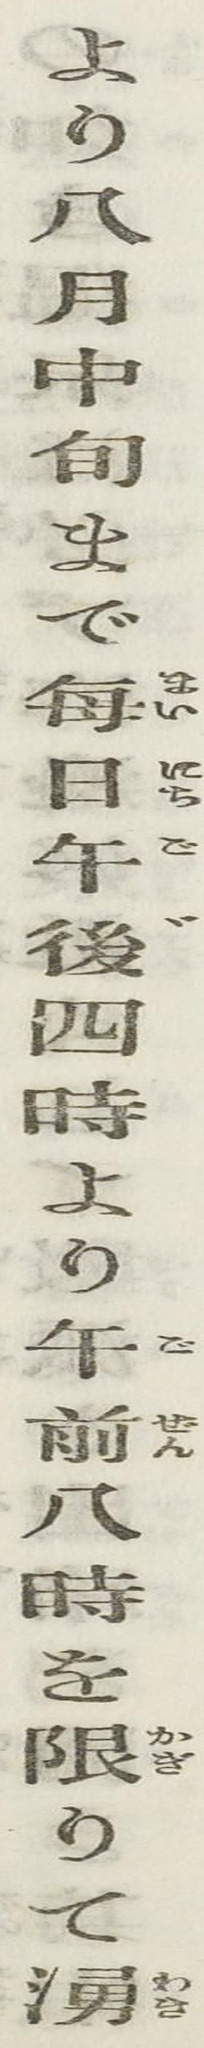より八月中旬まで毎日午後四時より午前八時を限りて湧
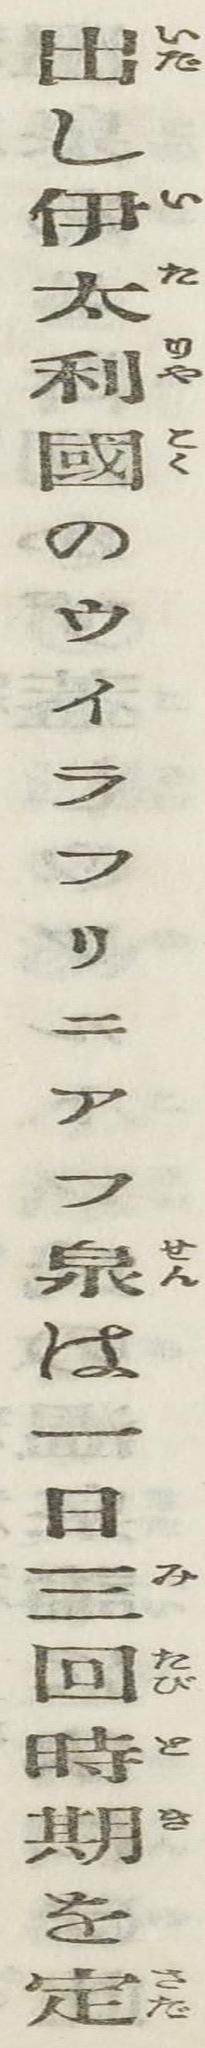出し伊太利國のウイラフリニアフ泉は一日三回時期を定
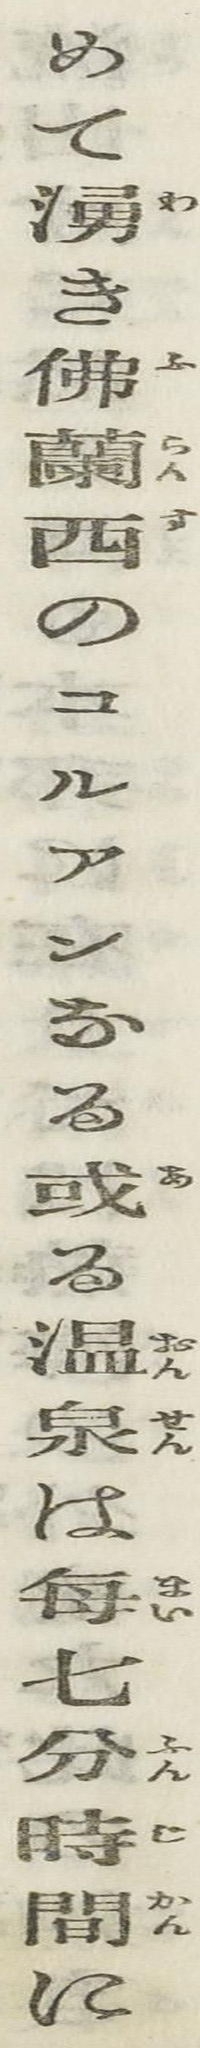めて湧き佛蘭西のコルアンなる或る温泉は毎七分時間に

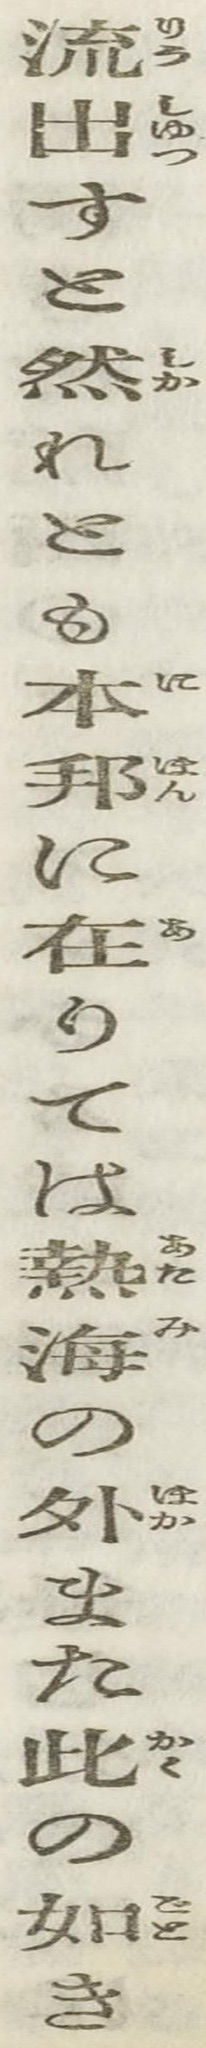流出すと然れとも本邦に在りては熱海の外また此の如き
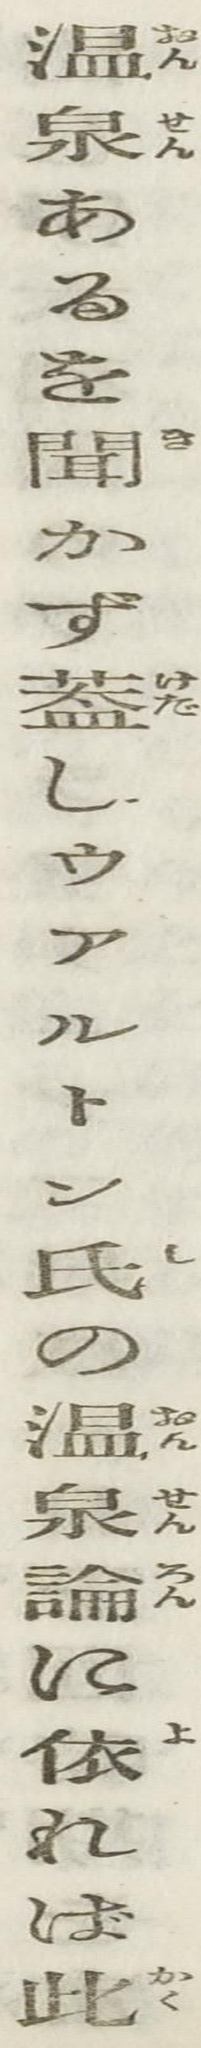温泉あるを聞かず蓋しウアルトン氏の温泉論に依れば此
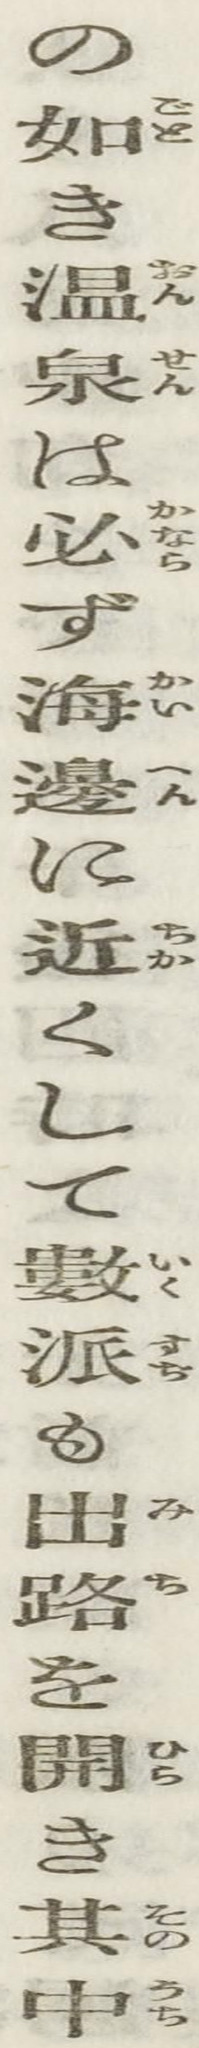の如き温泉は必ず海邊に近くして数派も出路を開き其中
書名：熱海獨案内　全
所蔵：東京大学地震研究所図書室 Earthquake Research Institute Library, The University of Tokyo, JAPAN
